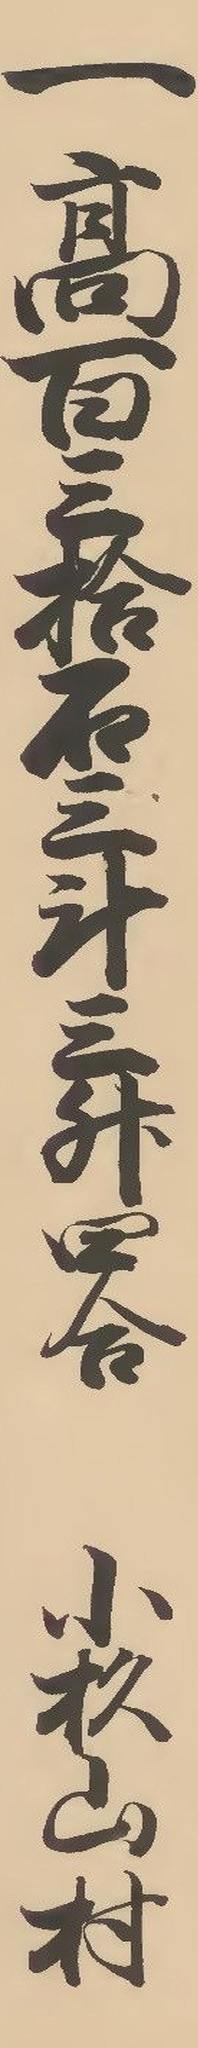一高百三拾石三斗三升四合小杉山村
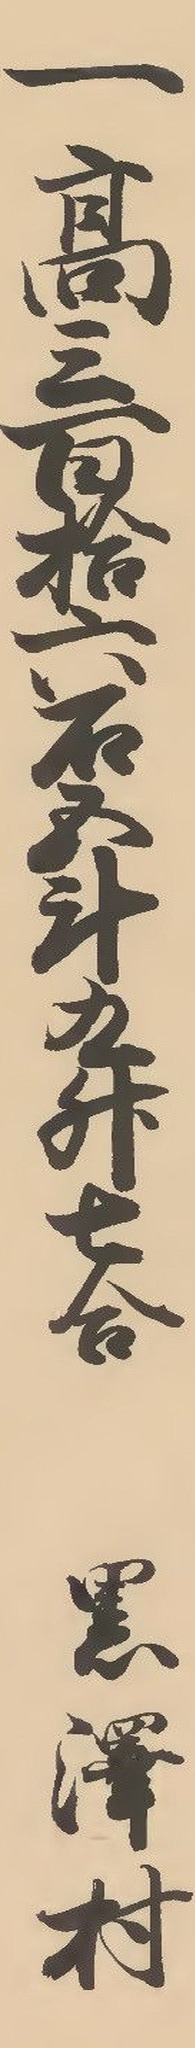一高三百拾六石五斗九升七合黒沢村
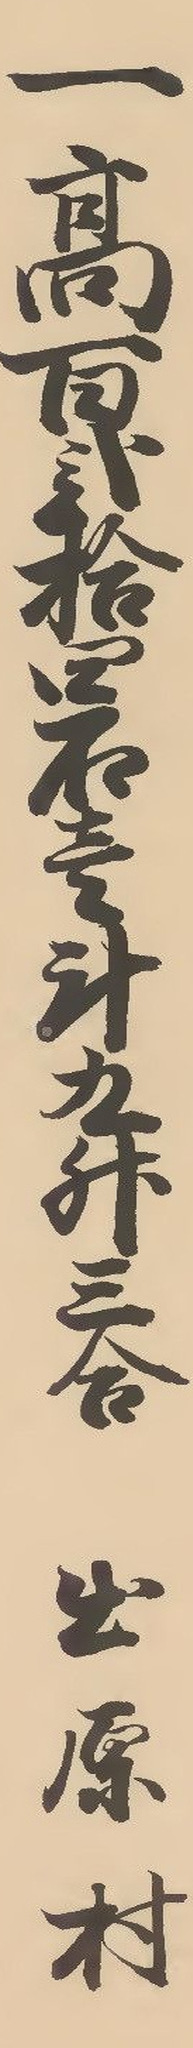一高百弐拾四石壱斗九升三合出原村
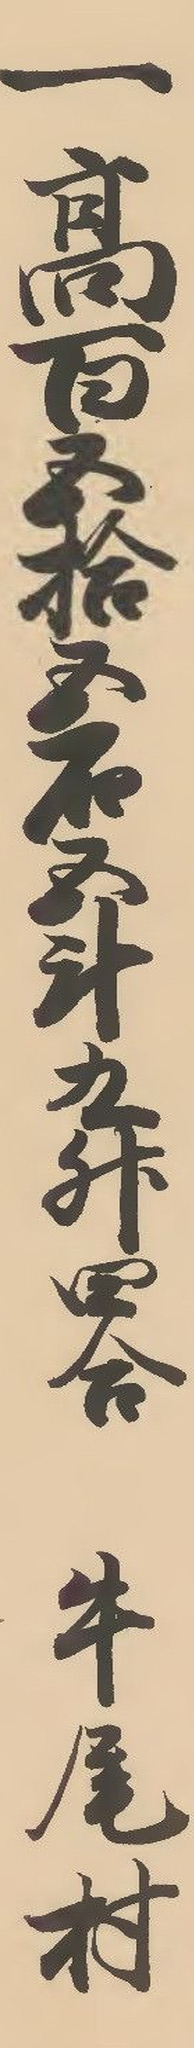一高百五拾五石五斗九升四合牛尾村
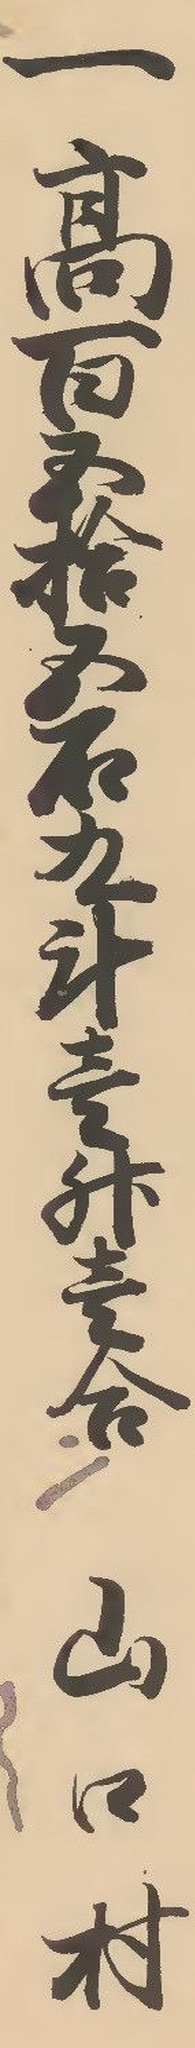一高百五拾五石九斗壱升壱合山口村

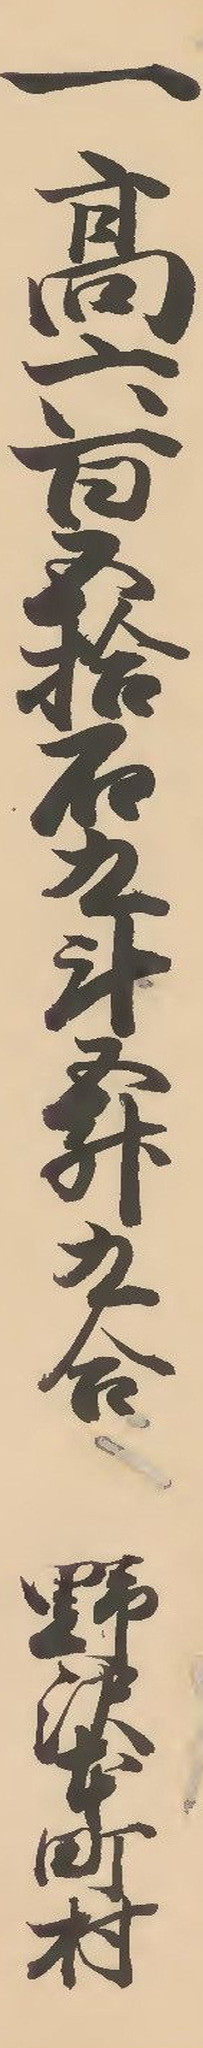一高六百五拾石九斗五升九合野沢本町村
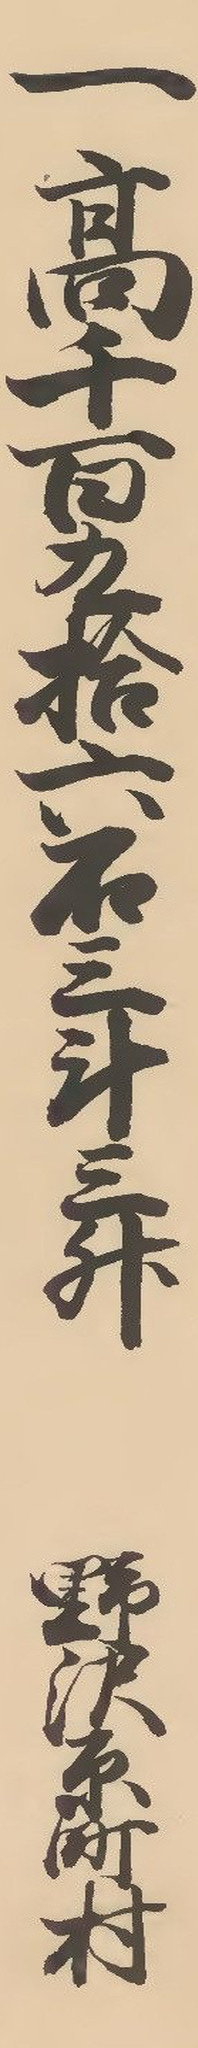一高千百九拾六石三斗三升野沢原町村
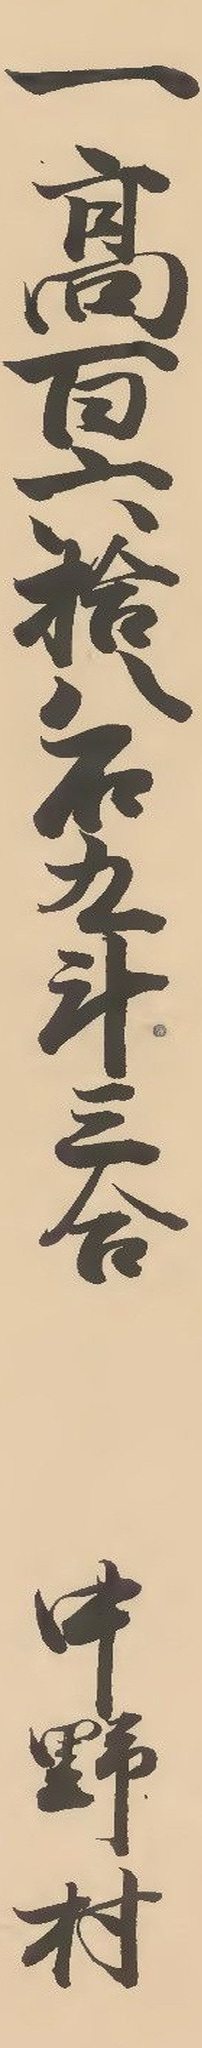一高六百拾八石九斗三合中野村
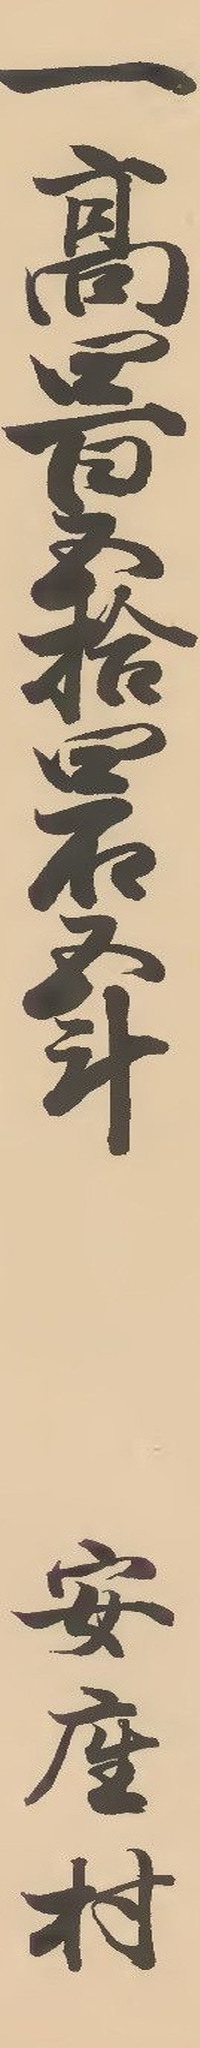一高四百五拾四石五斗安座村
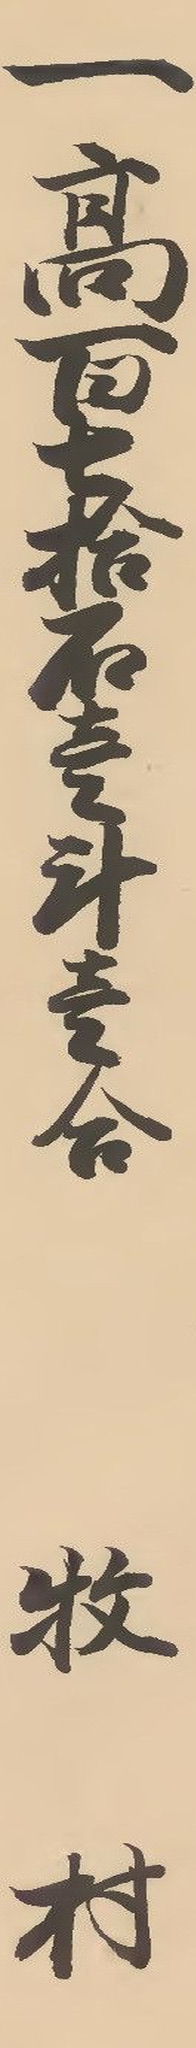一高百七拾石壱斗壱合牧村
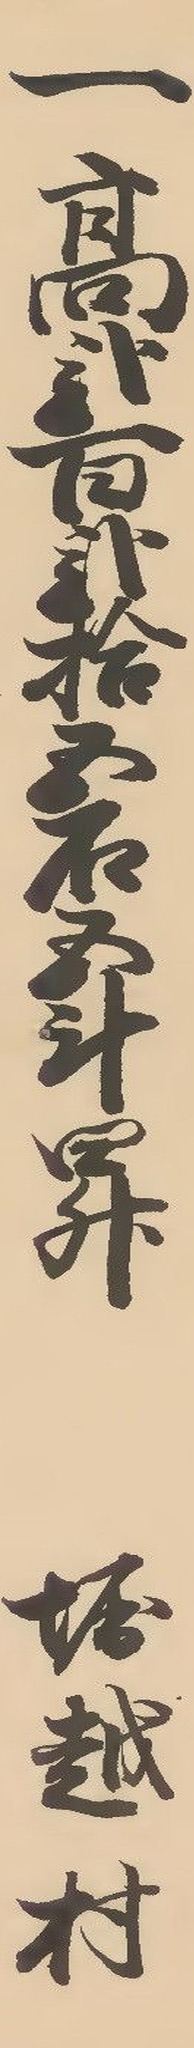一高弐百弐拾五石五斗四升堀越村
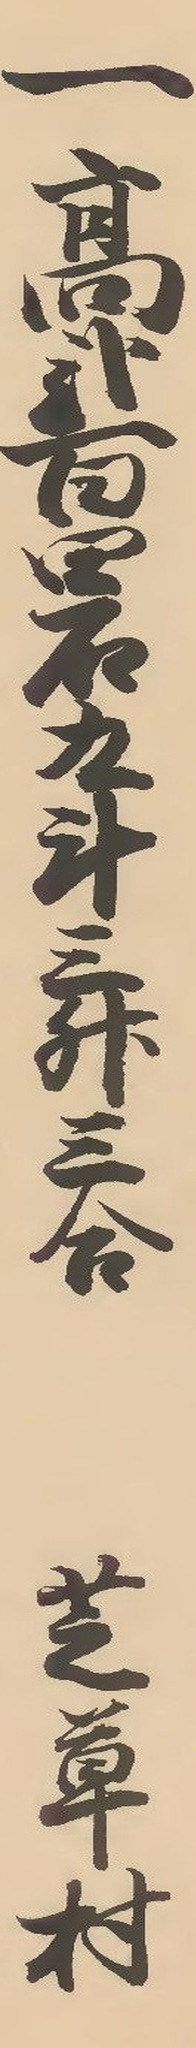一高弐百四石九斗三升三合芝草村
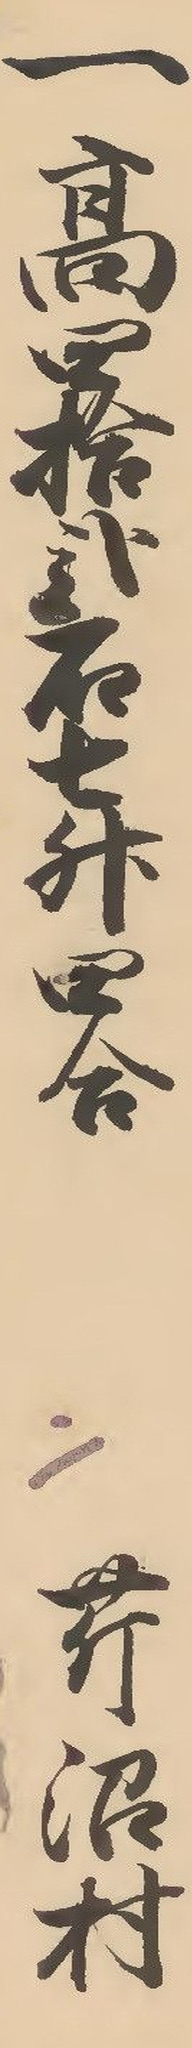一高四拾弐石七升四合芹沼村

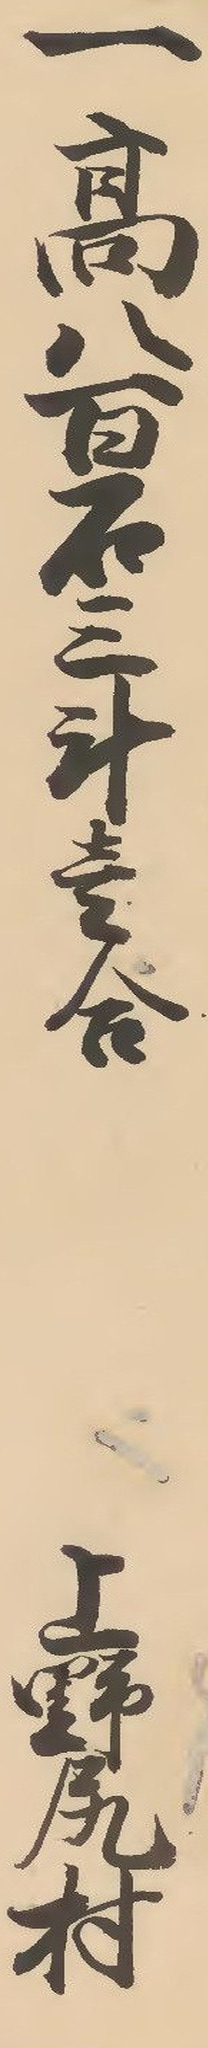一高八百石三斗壱合上野尻村
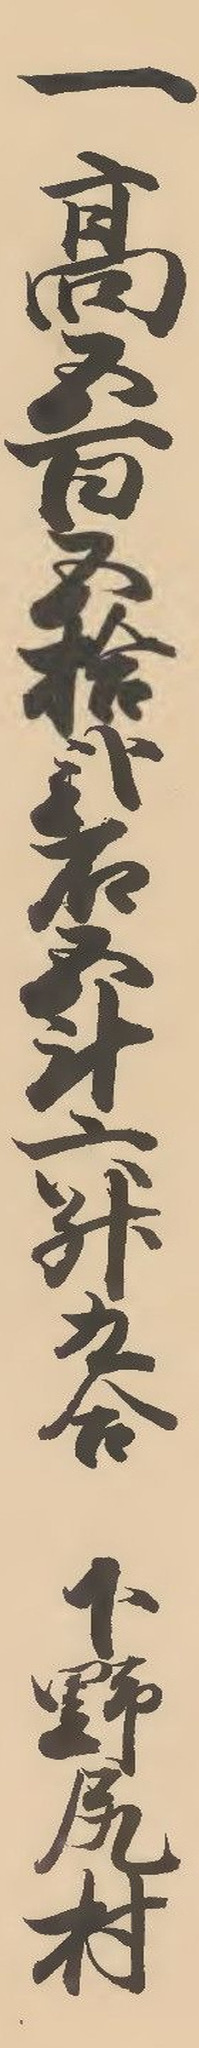一高五百五拾弐石五斗六升九合下野尻村
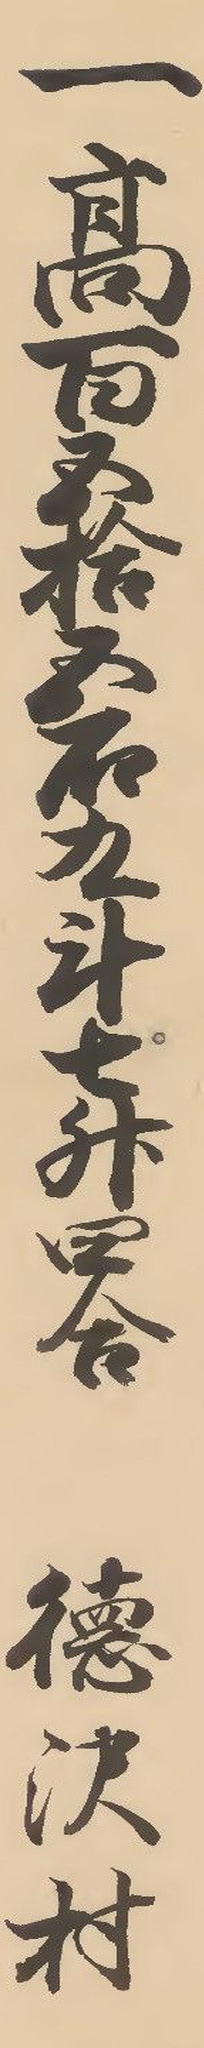一高百五拾五石九斗七升四合徳沢村
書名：陸奥国郷帳　１
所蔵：国立公文書館 National Archives of Japan
